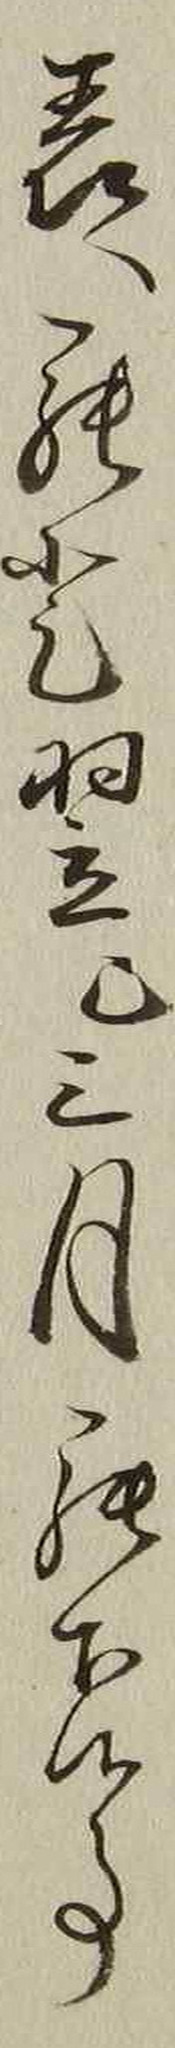表へ罷登翌巳三月罷下候事
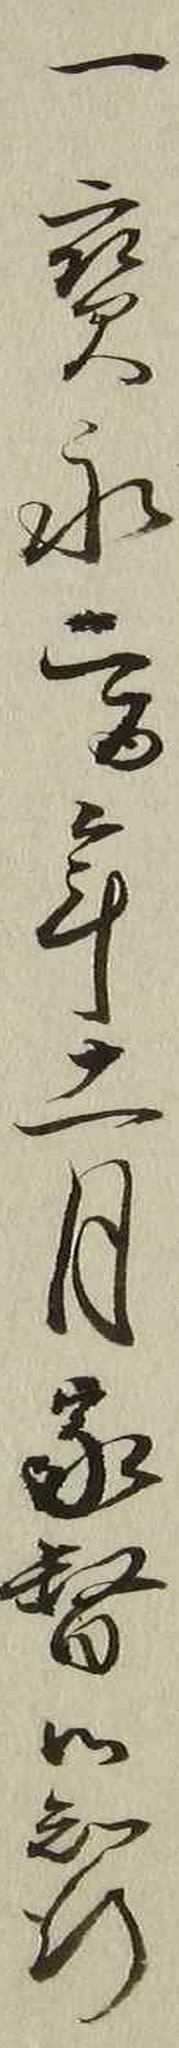一寛永二酉年十一月家督御知行
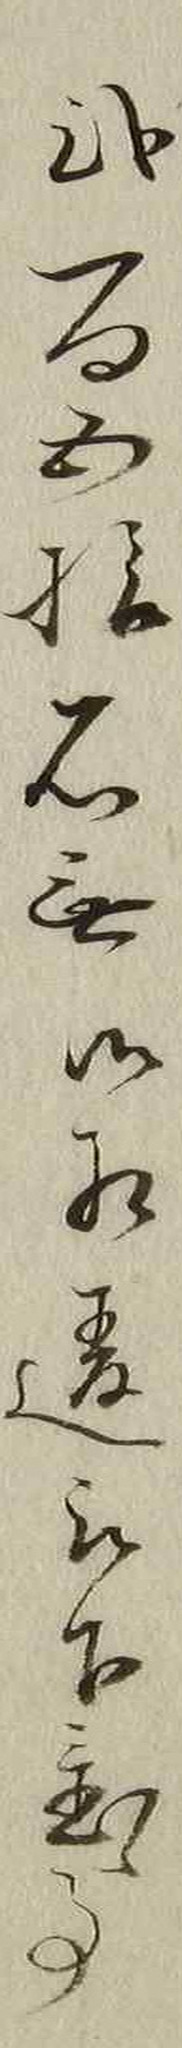弐百五拾石無御相違被下置候事
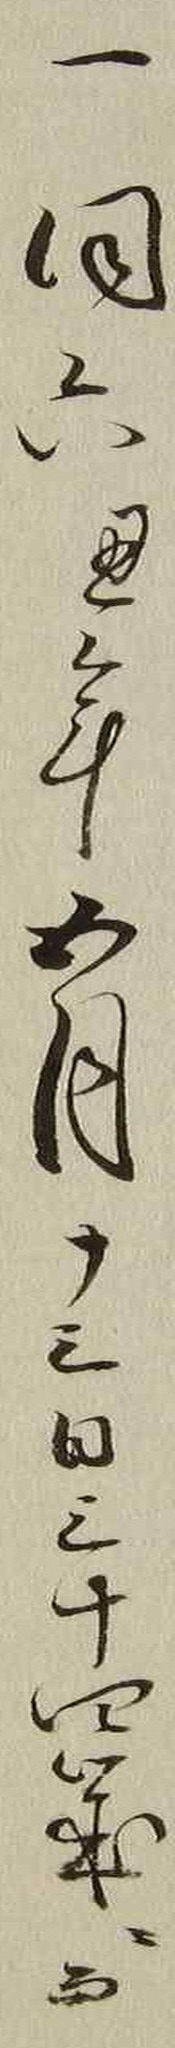一同六丑年五月十三日三十四歳ニ而
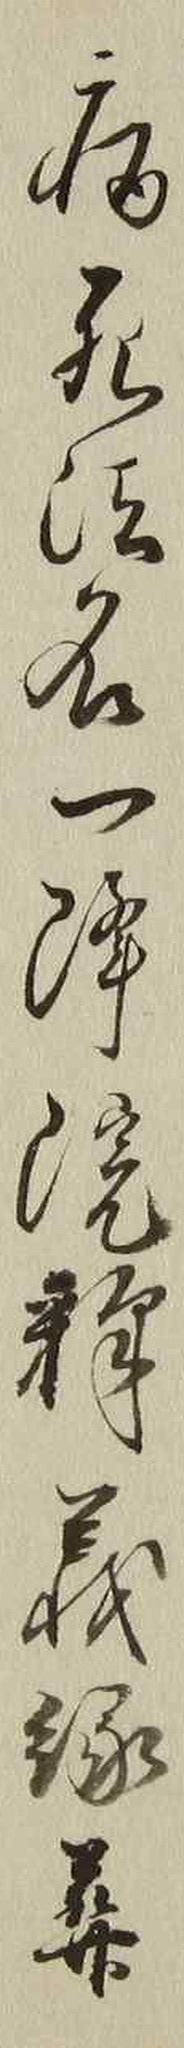病死法名一降院釈義縁葬
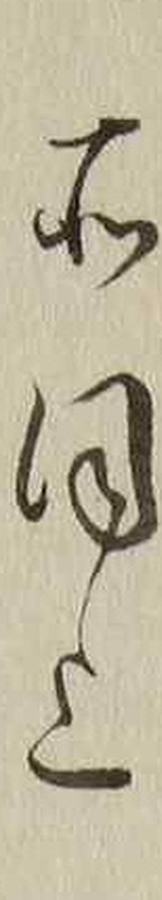所同上
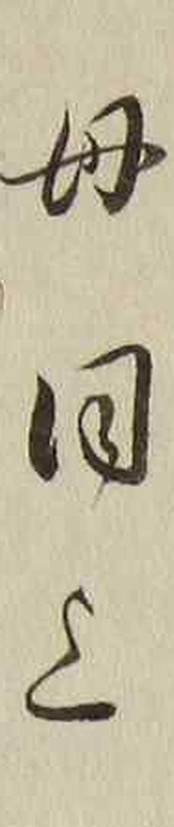母同上
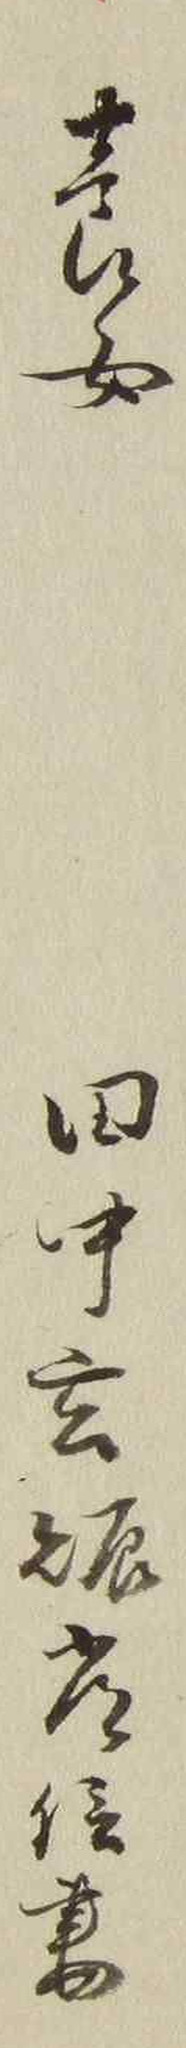養女田中玄賑常信妻
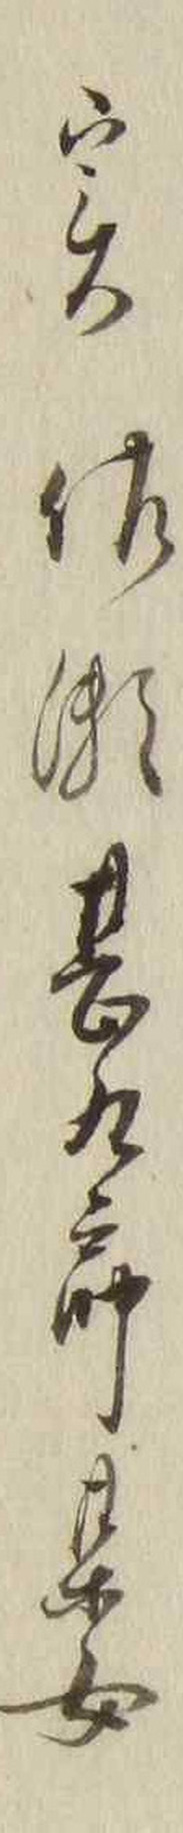実佐瀬甚九郎某女

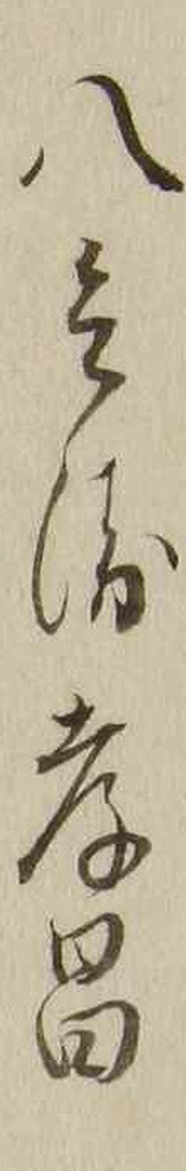八兵衛孝昌
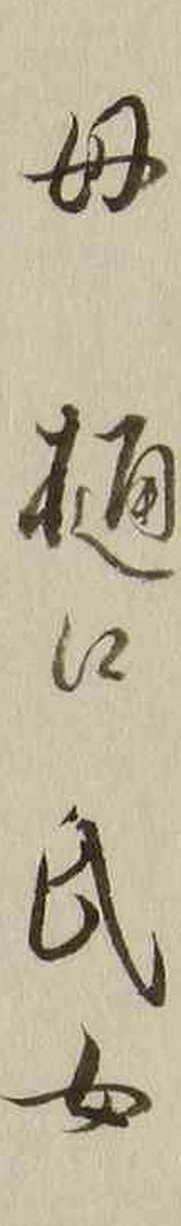母樋口氏女
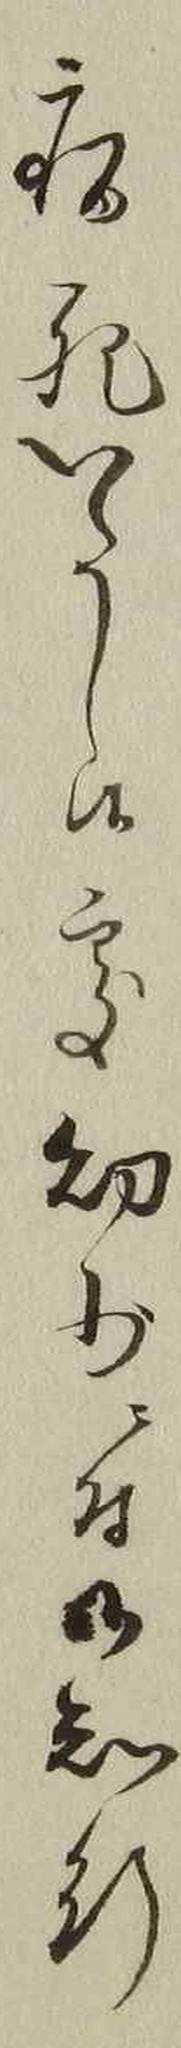病死いたし候処幼少ニ付御知行
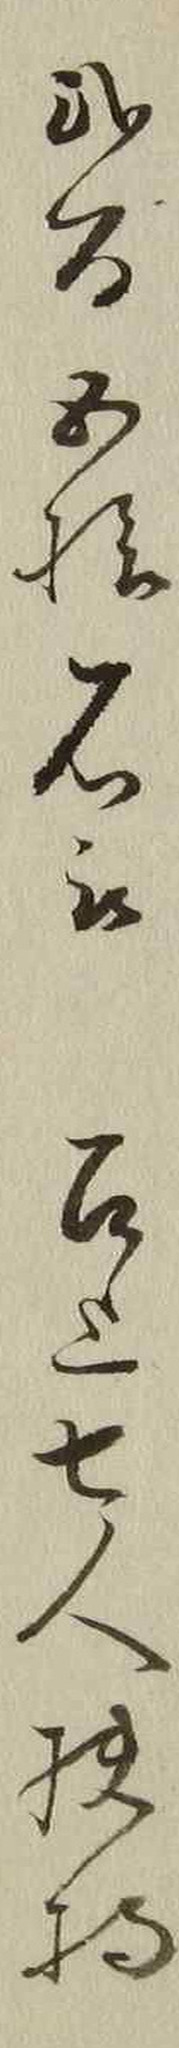弐百五拾石被召上七人扶持
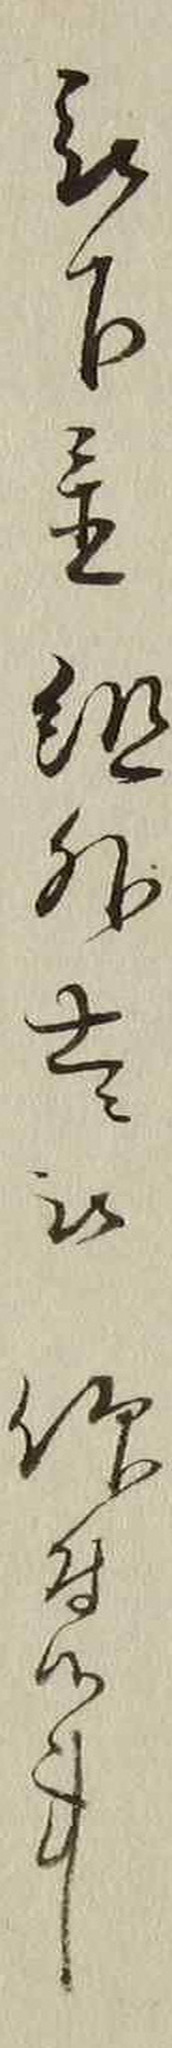被下置組外士ニ被仰付候事
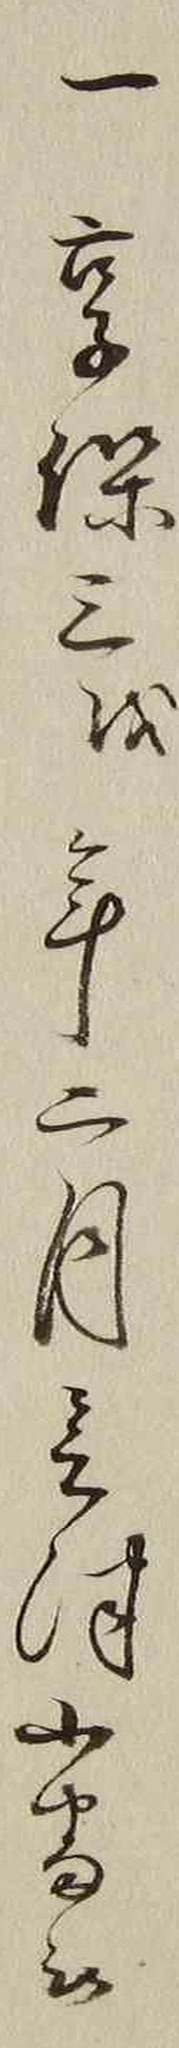一享保三戌年二月会津小番被
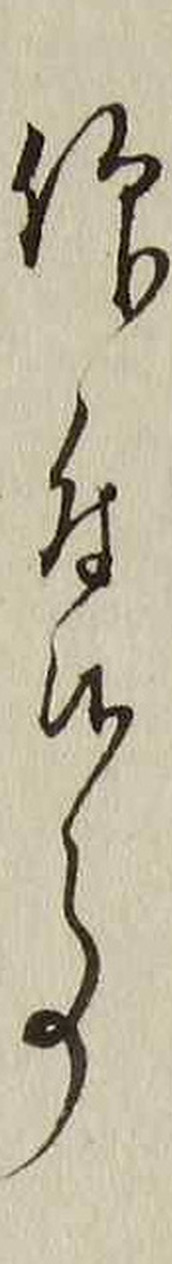仰付候事
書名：諸士系譜　巻之129　た之部5
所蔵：会津若松市立会津図書館
